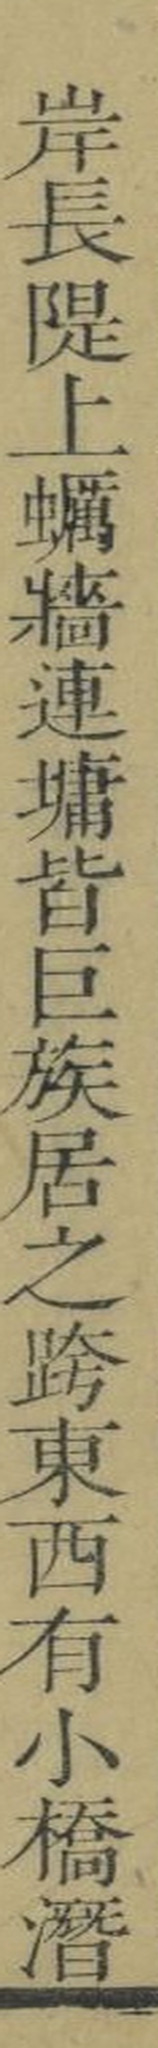岸長隄上蠣牆連墉皆巨族居之跨東西有小橋潛
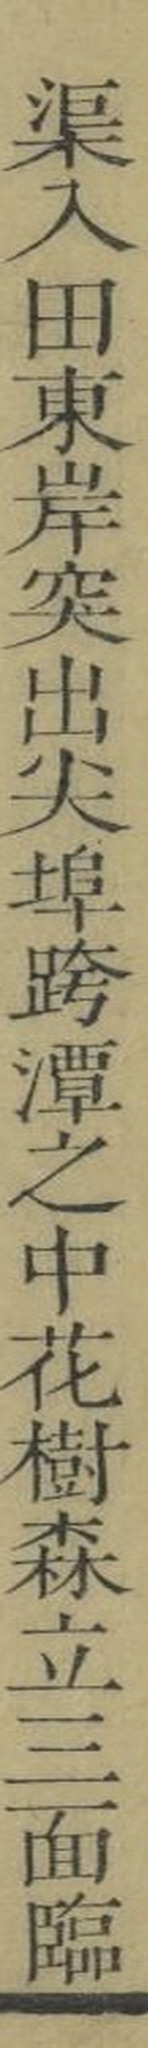渠入田東岸突出尖埠跨潭之中花樹森立三面臨
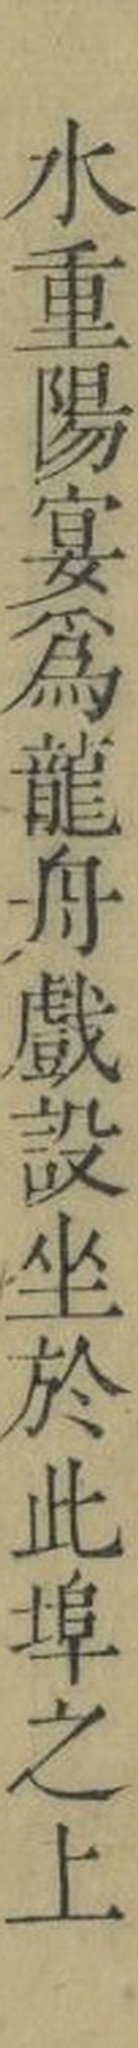水重陽宴爲龍舟戲設坐於此埠之上
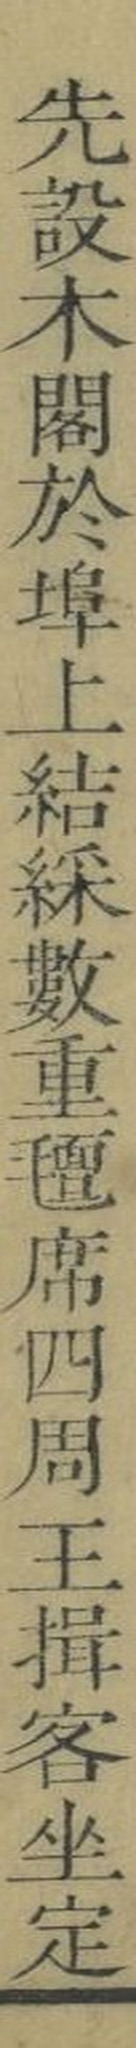先設木閣於埠上結綵數重氊席四周王揖客坐定
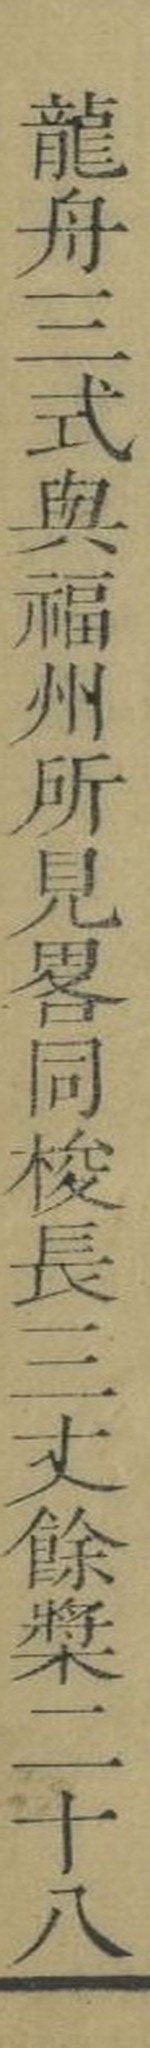龍舟三式與福州所見畧同梭長三丈餘槳二十八

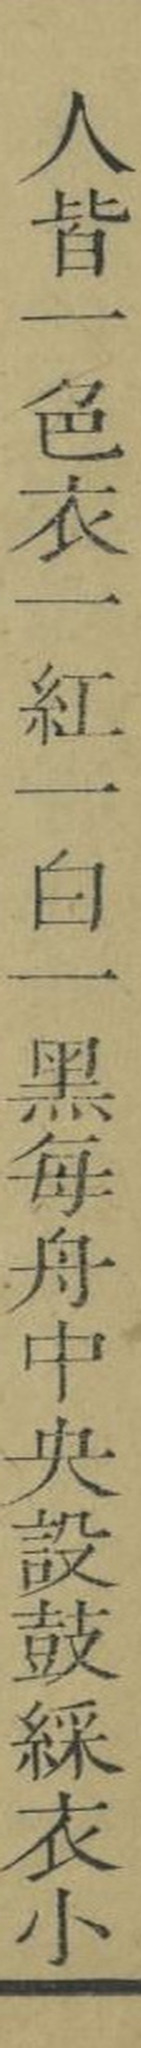人皆一色衣一紅一白一黑每舟中央設鼓綵衣小
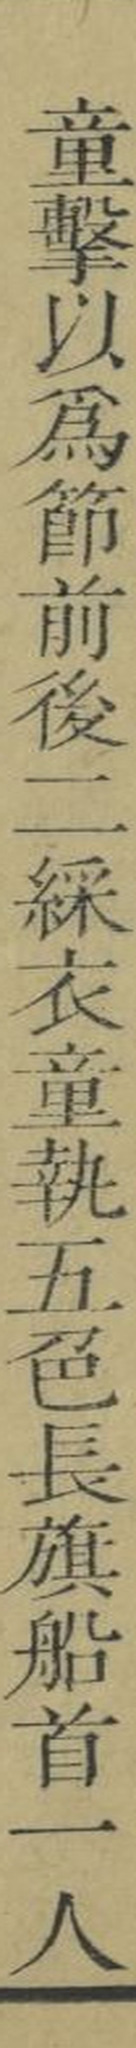童擊以爲節前後二綵衣童執五色長旗船首一人
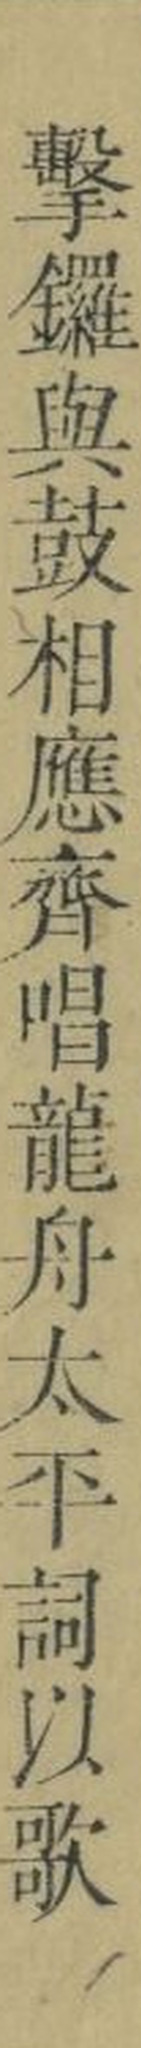擊鑼與鼓相應齊唱龍舟太平詞以歌
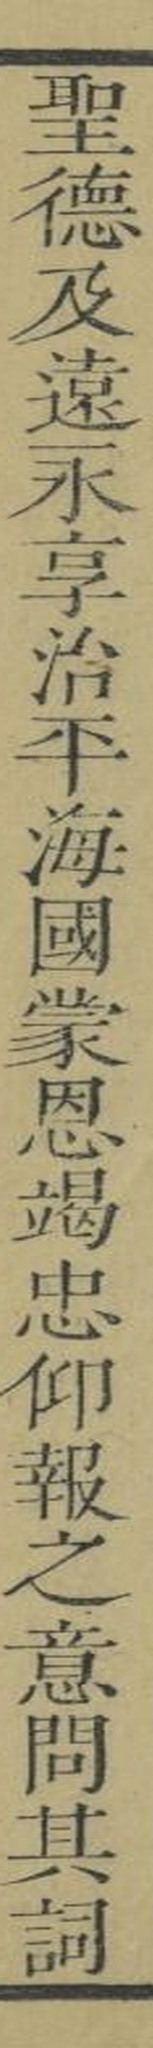聖德及遠永享治平海國蒙恩竭忠仰報之意問其詞
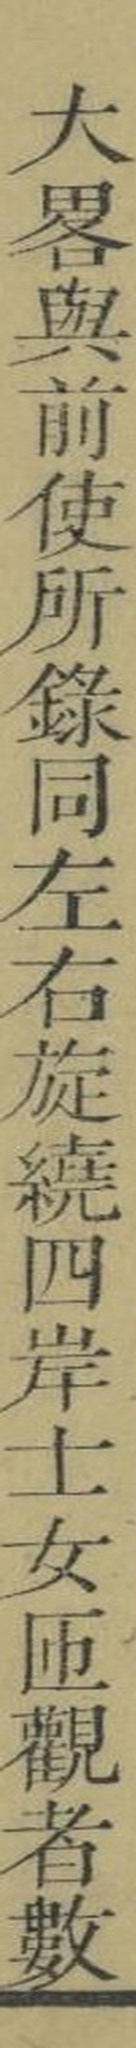大畧與前使所錄同左右旋繞四岸士女匝觀者數
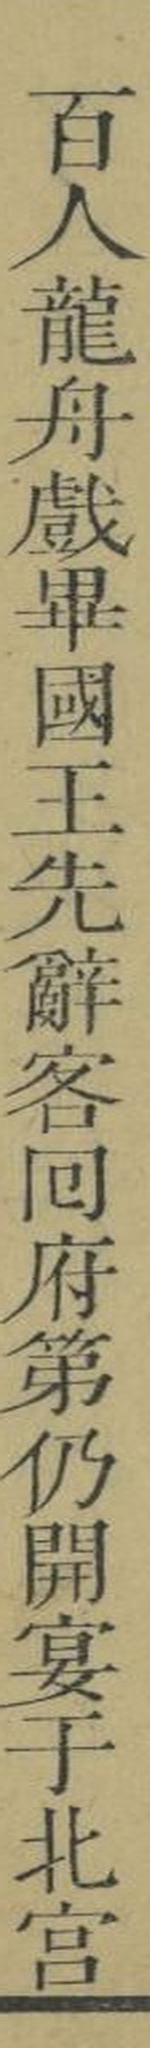百人龍舟戲畢國王先辭客囘府第仍開宴于北宫
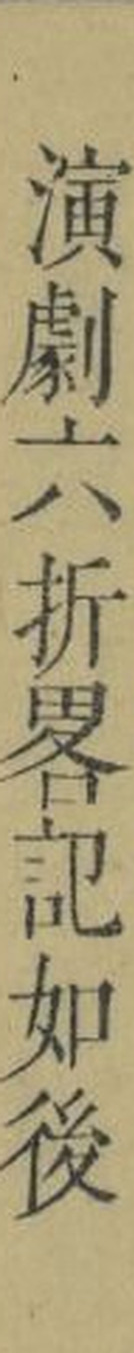演劇六折畧記如後
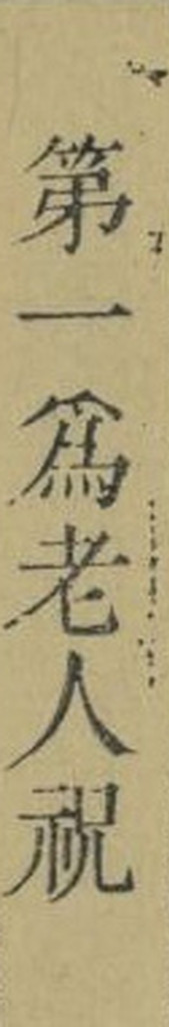第一爲老人祝
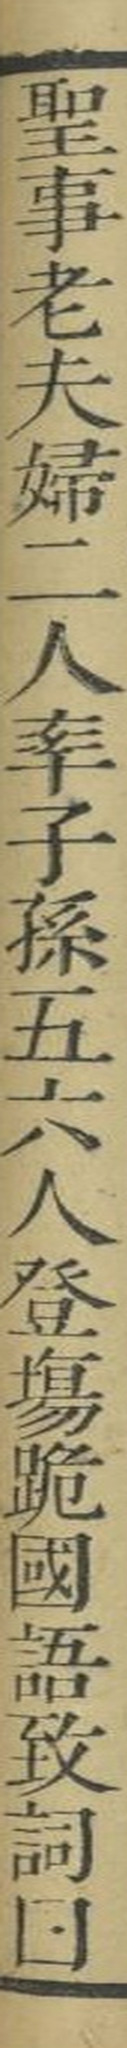聖事老夫婦二人率子孫五六人登塲跪國語致詞曰
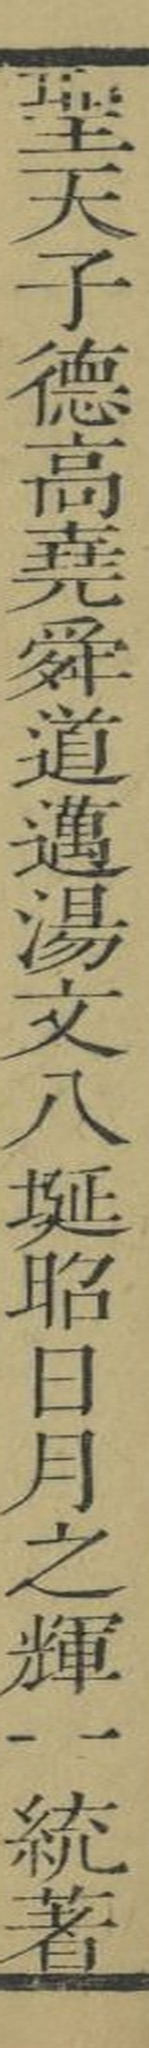聖天子德高堯舜道邁湯文八埏昭日月之輝一統著
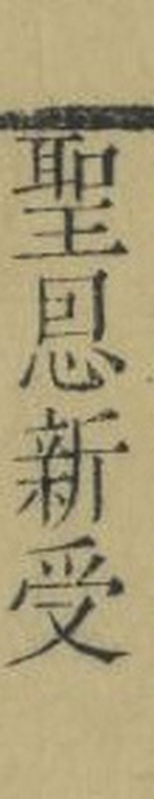聖㤙新受
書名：中山伝信録 巻二
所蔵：University of the Ryukyus Library
